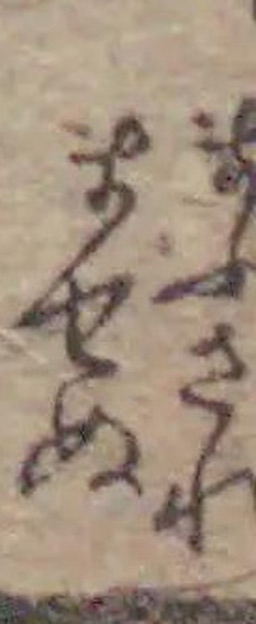ませぬ
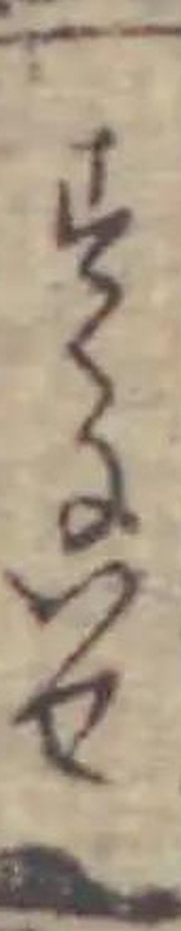すくにいせ
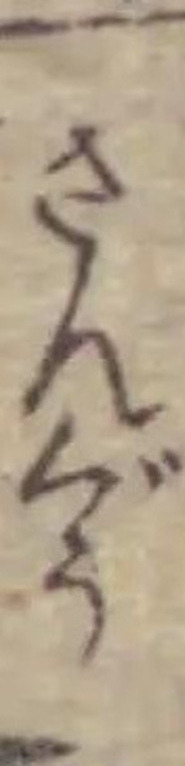さんぐう
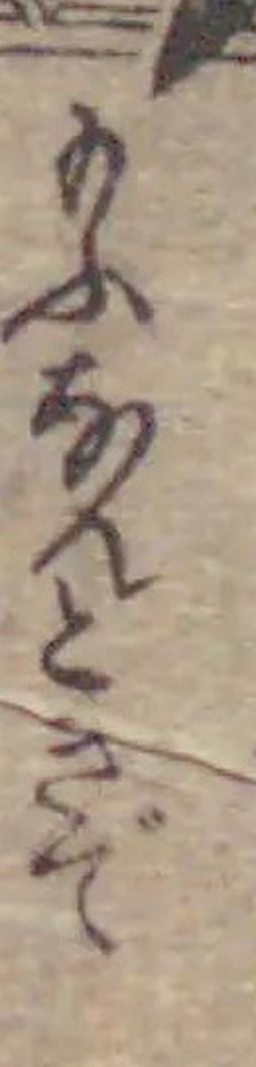もふなんときで
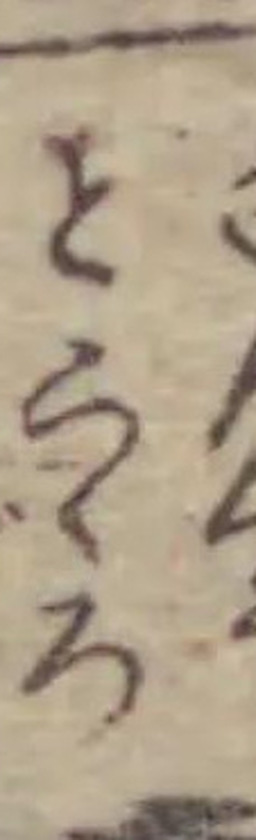をこゝろ
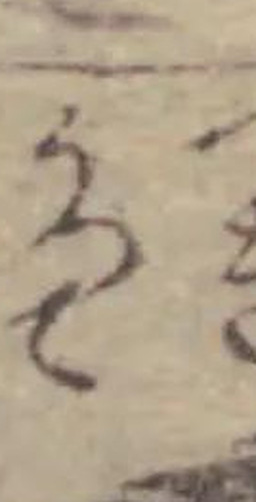うつて
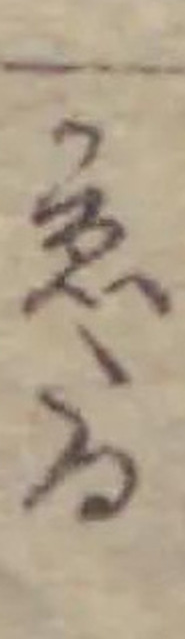かゑたる
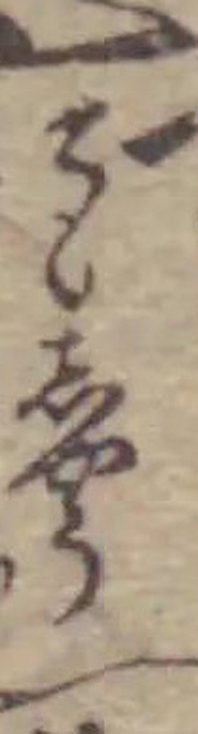てもしやう
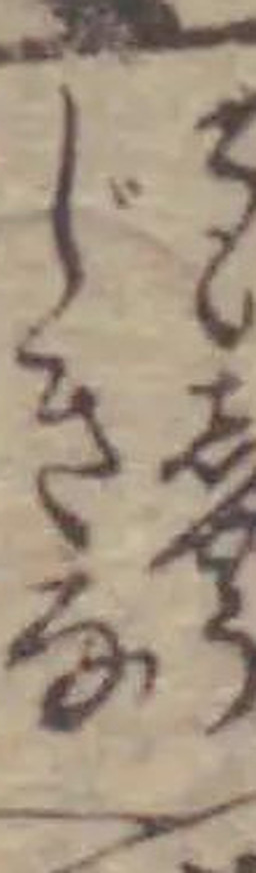じきな
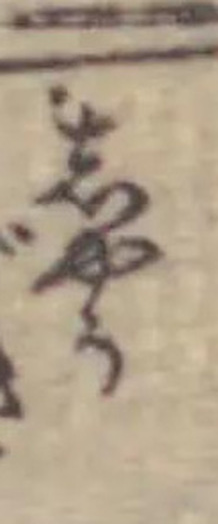しやう
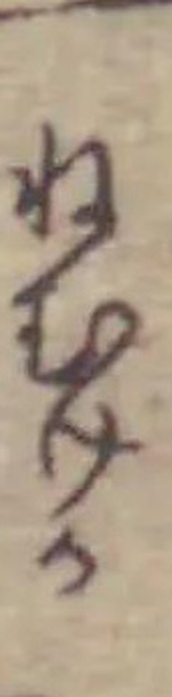ねむけか
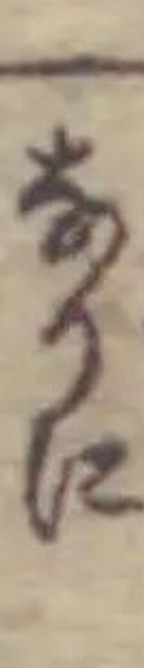なりに
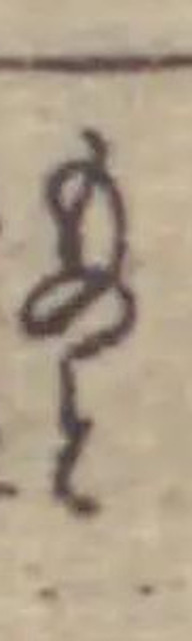ものと
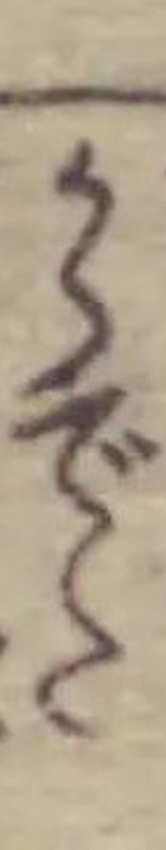からでた
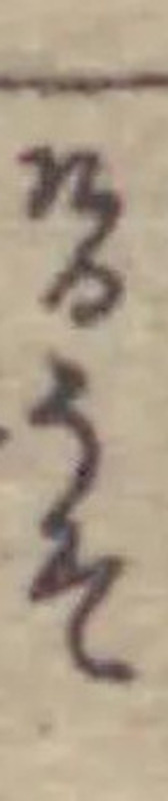けるうそ
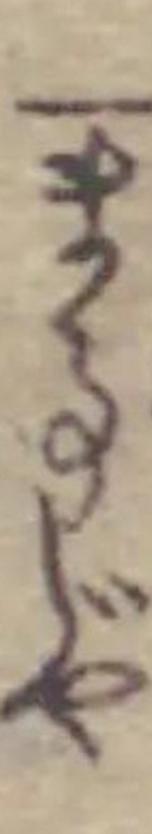ま事じや
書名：虚言弥二郎傾城誠 3巻
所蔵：国立国会図書館 National Diet Library, JAPAN
